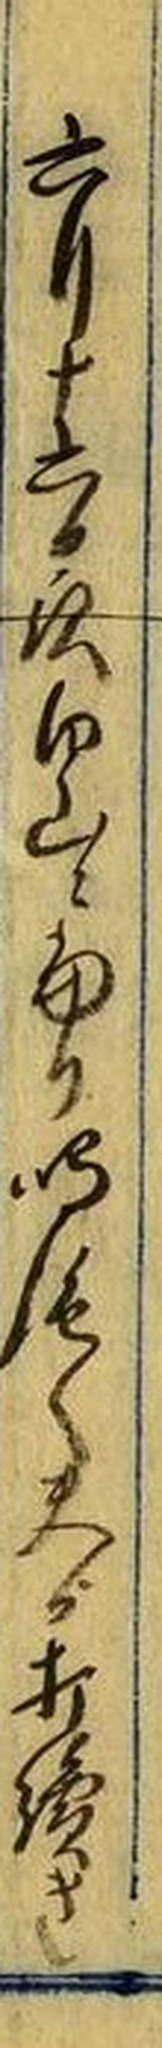六月十六日夜白山ニ当り鳴強く夫ゟ打続き
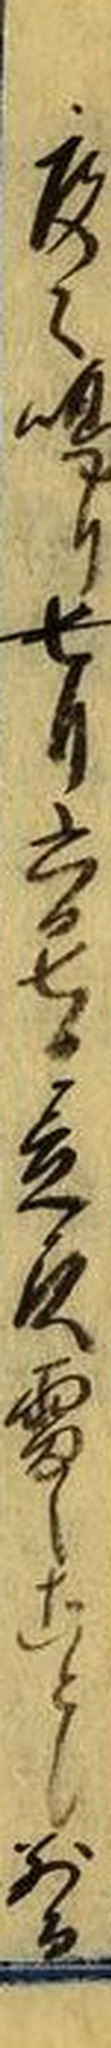度々鳴り七月六日七日昼夜雷之ことし別而
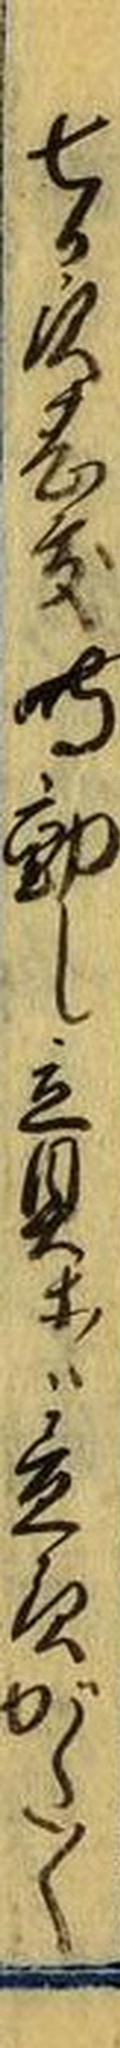七日夜甚敷鳴動し立具等ハ昼夜がた〳〵
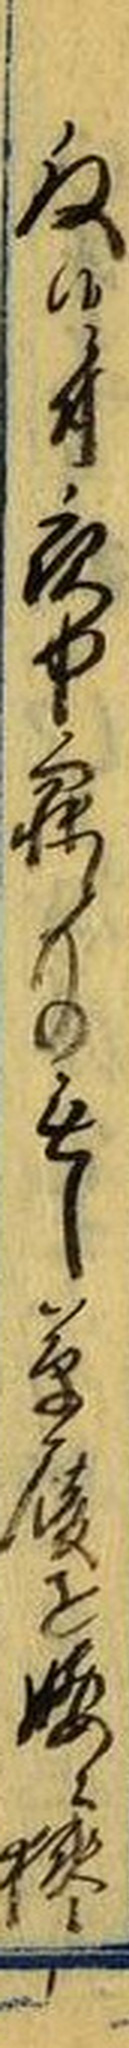致候ニ付夜中寝候もの無し草履を腰ニ挟ミ
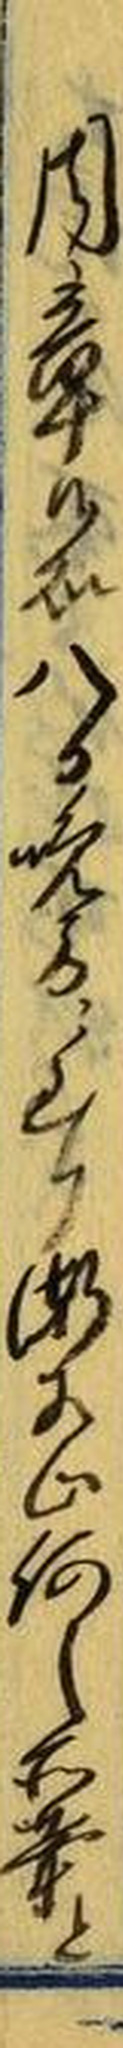周章候処八日晩方ニ至り漸相止何之所業と
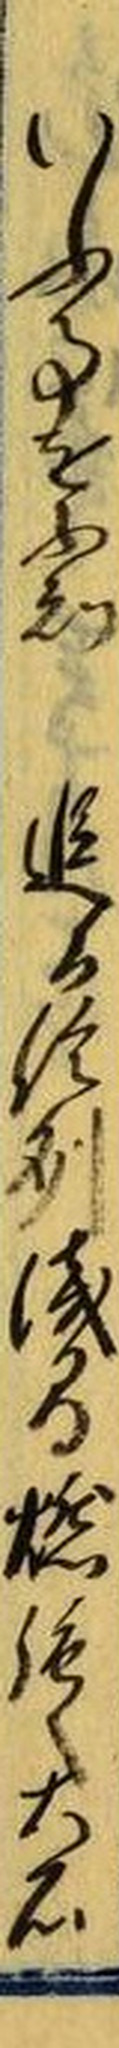いふ事を不知追而信州浅間燃強く大石
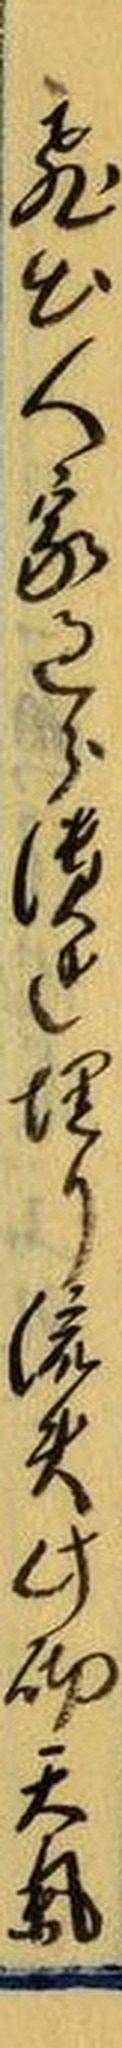飛出人家過分潰れ埋り流失此砌天気
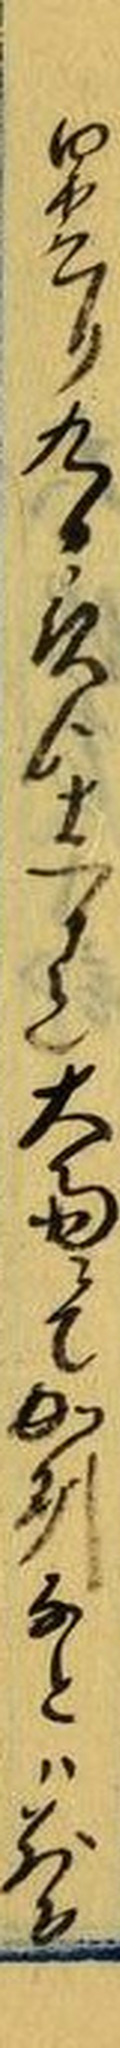曇り九日夜ゟ十二日迄大雨ニて加州なとハ別而
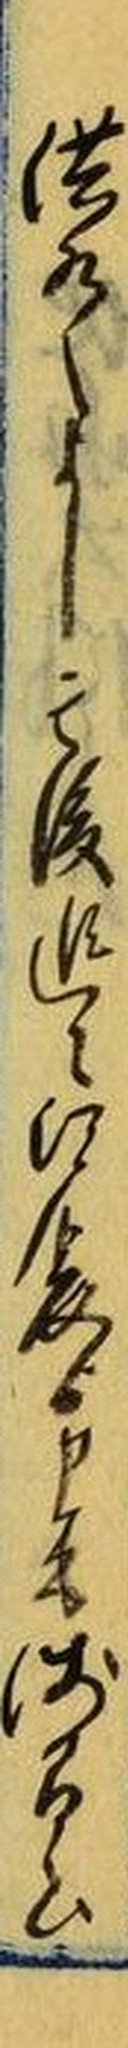洪水之よし其後追々江戸表ゟ申来浅間山
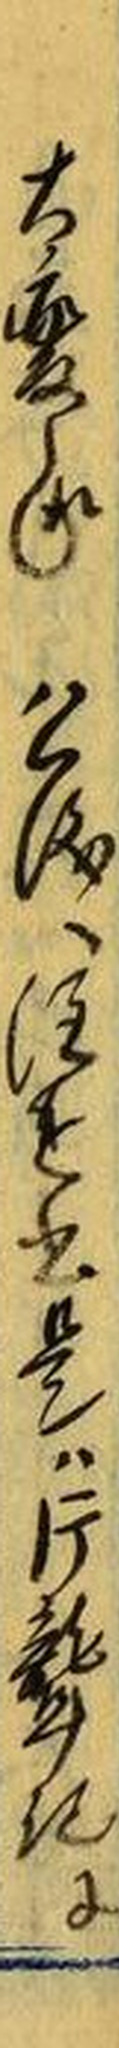大変之趣公儀へ注進書是ハ片聾記に
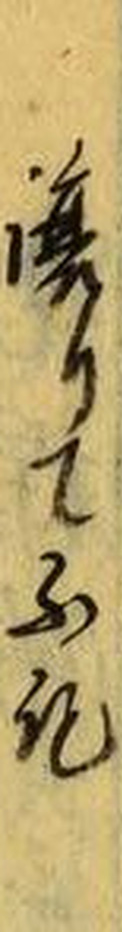譲りて不記
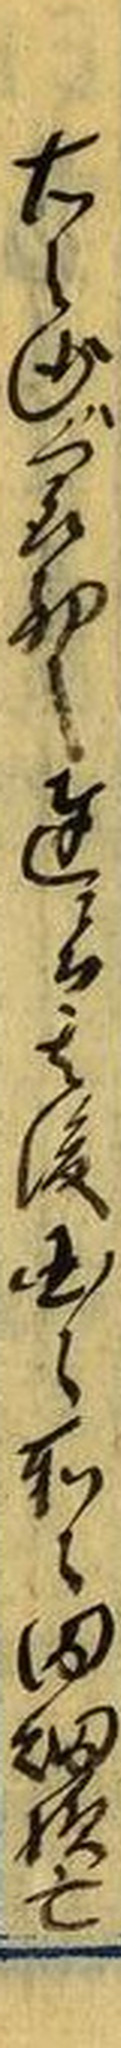右之趣ハ最初之達ニ而其後国々所々田畑損亡
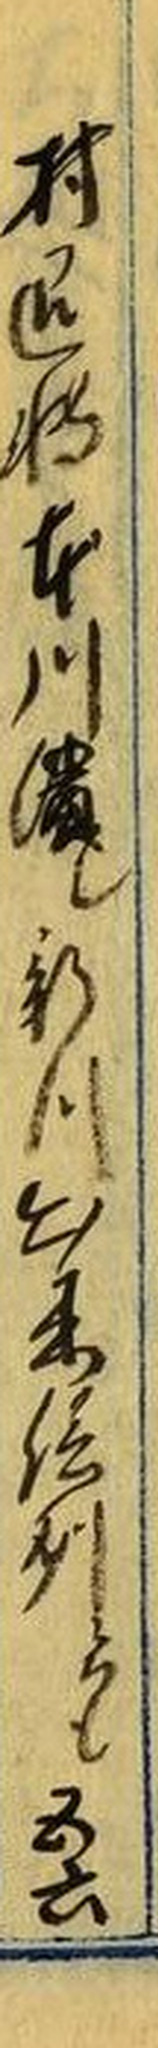村退転本川潰レ新川出来信州ニ而も五六
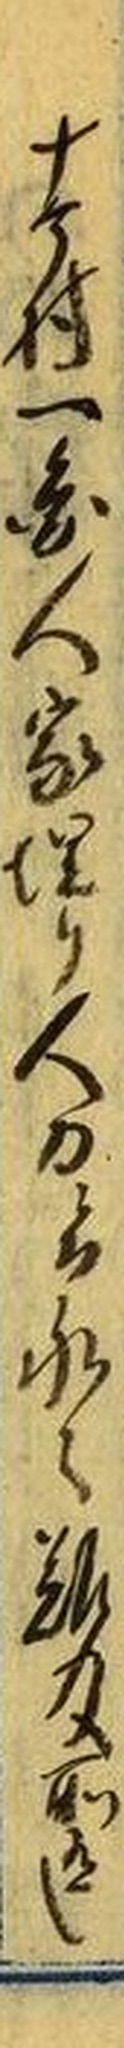十ヶ村一円人家埋り人力ニ而永く難及所有之
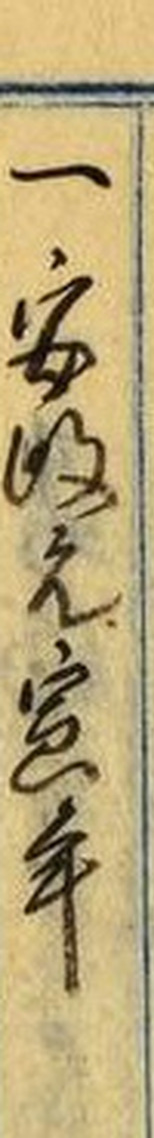一安政元寅年
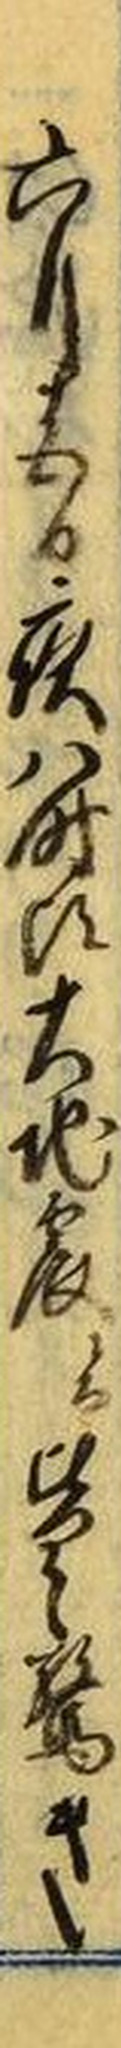六月十五日夜八時頃大地震ニ而皆々驚き
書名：温古集 五巻
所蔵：福井県文書館 Fukui Prefectural Archives
